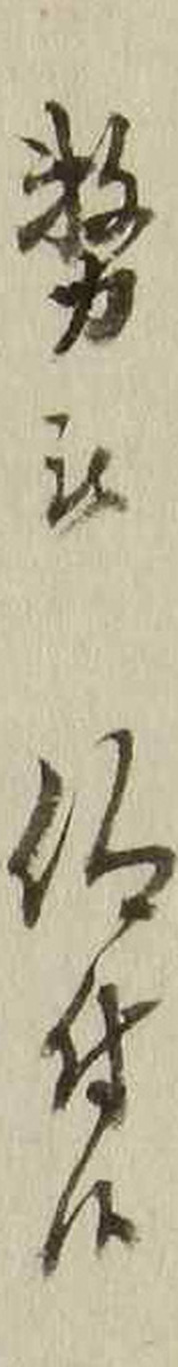務被仰付候
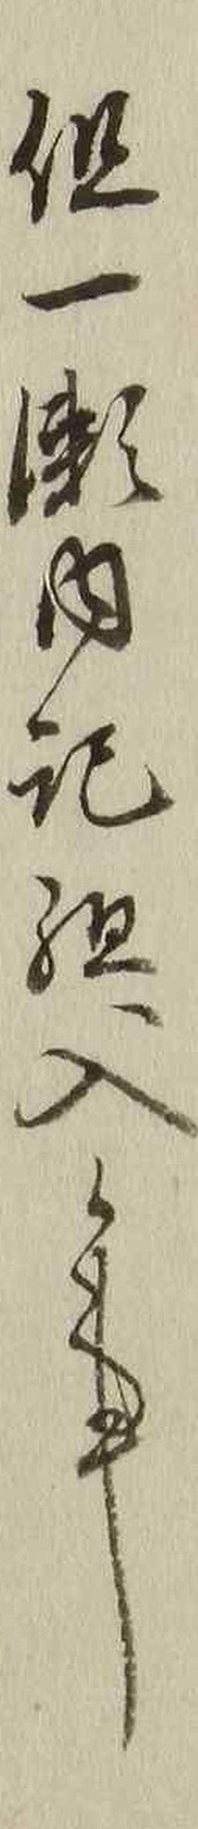但一瀬内記組へ入候事
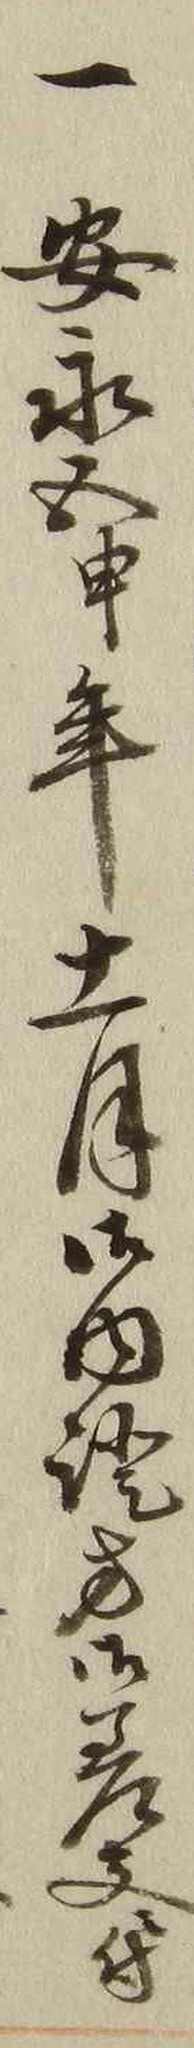一安永五申年十一月御内証方御差支ニ付
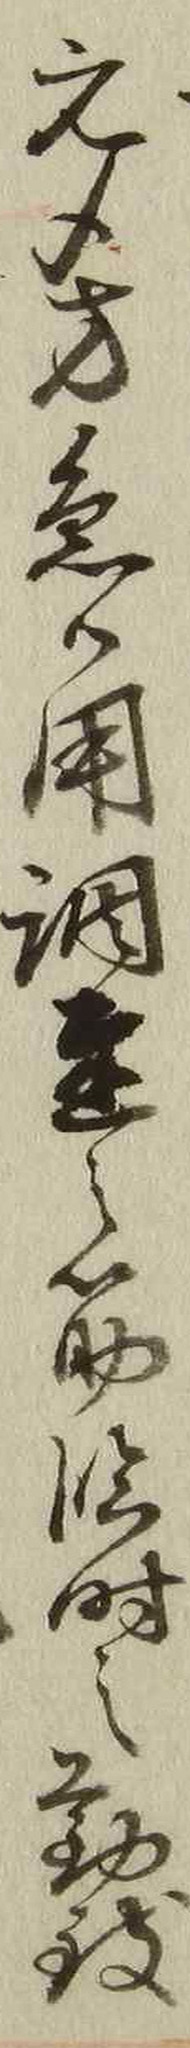元〆方急御用調達之筋臨時之勤致
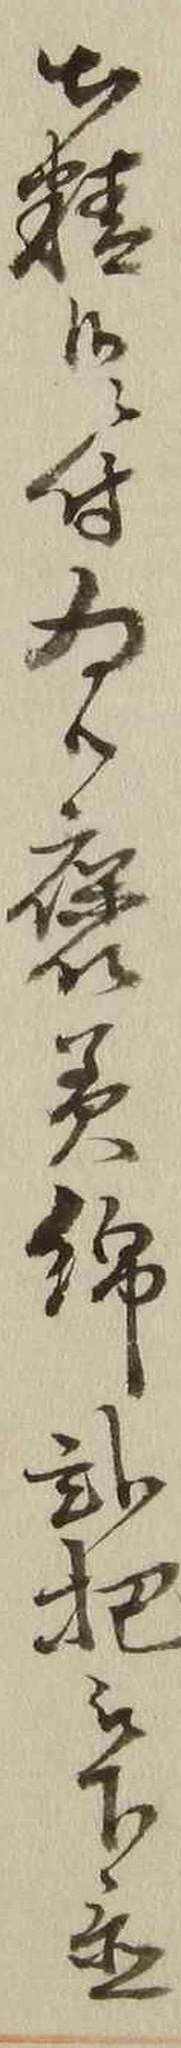出精候ニ付為御褒美綿弐把被下置
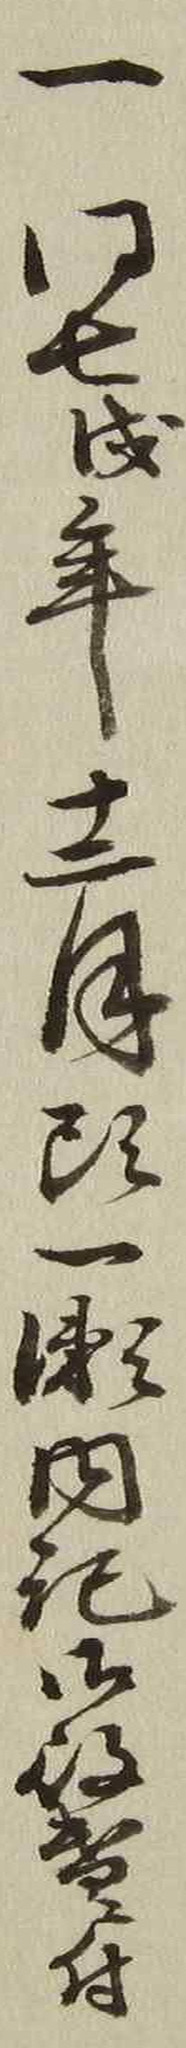一同七戌年十二月頭一瀬内記御役替ニ付
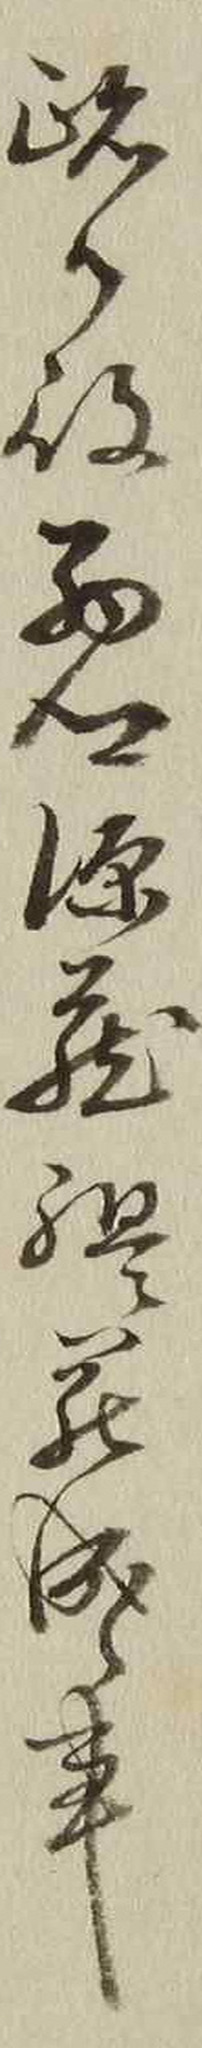跡御役西郷源蔵組ニ罷成候事
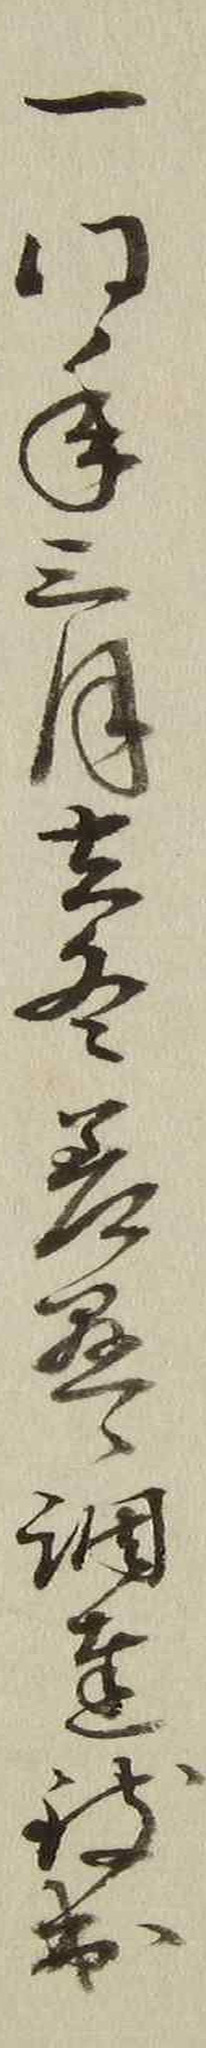一同年三月去冬差懸候調達致出
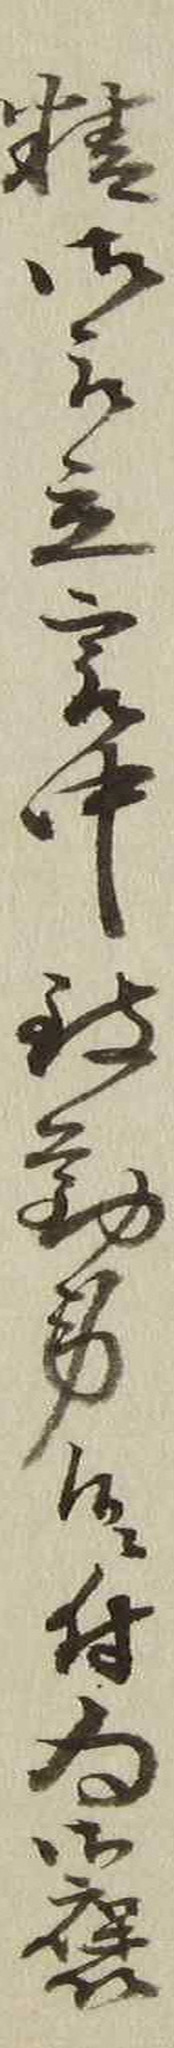精御取立最中致勤労候ニ付為御褒
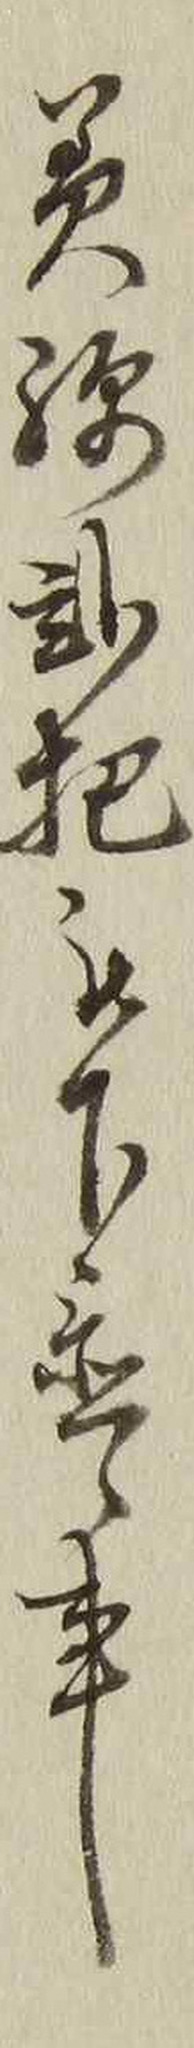美綿弐把被下置候事
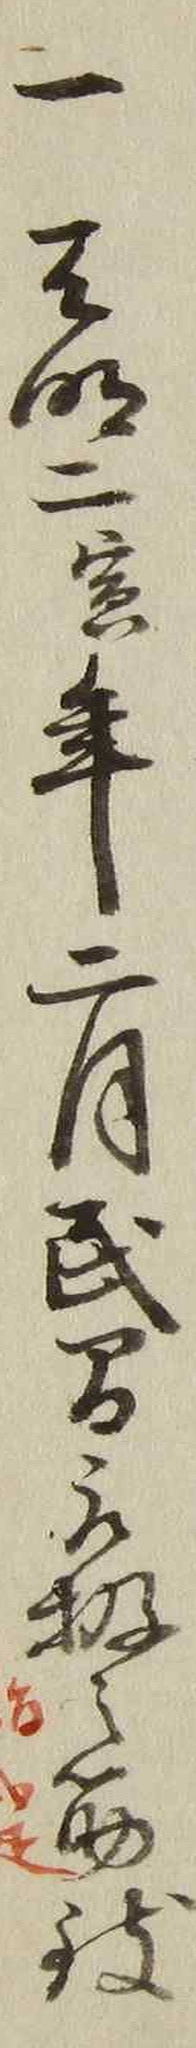一天明二寅年二月民間取扱之筋致
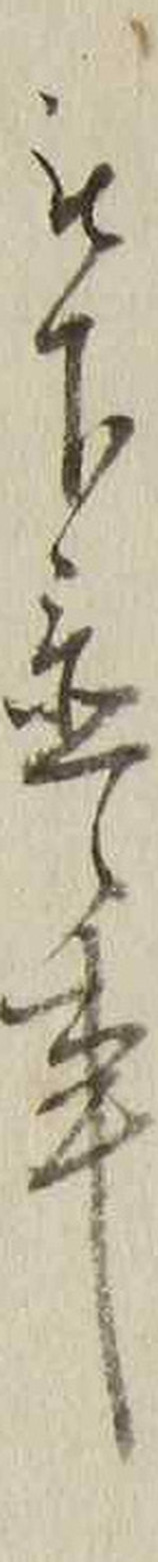被下置候事
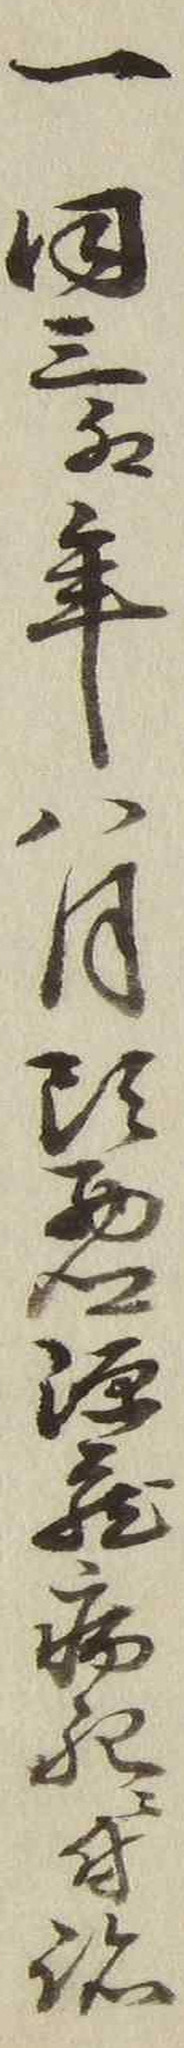一同三卯八月頭西郷源蔵病死ニ付跡
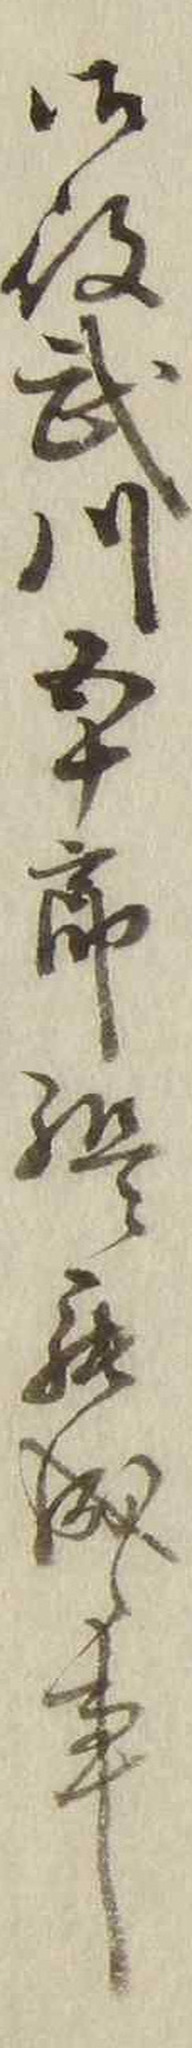御役武川五十郎組ニ罷成候事

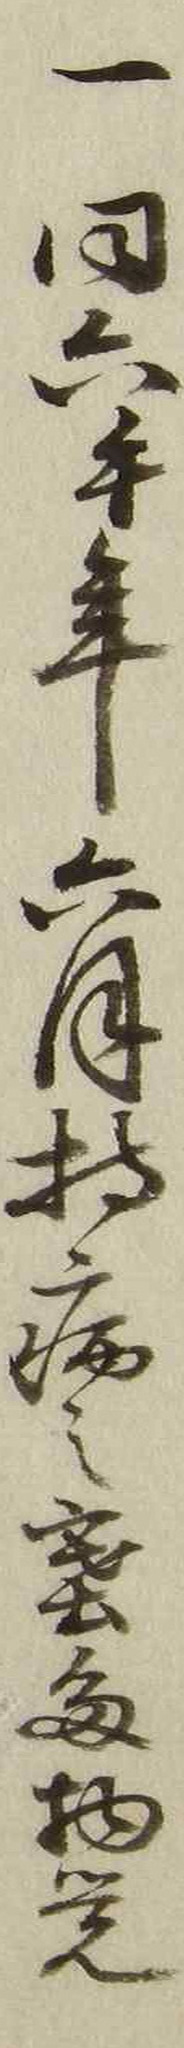一同六午年六月持病之塞多物覚
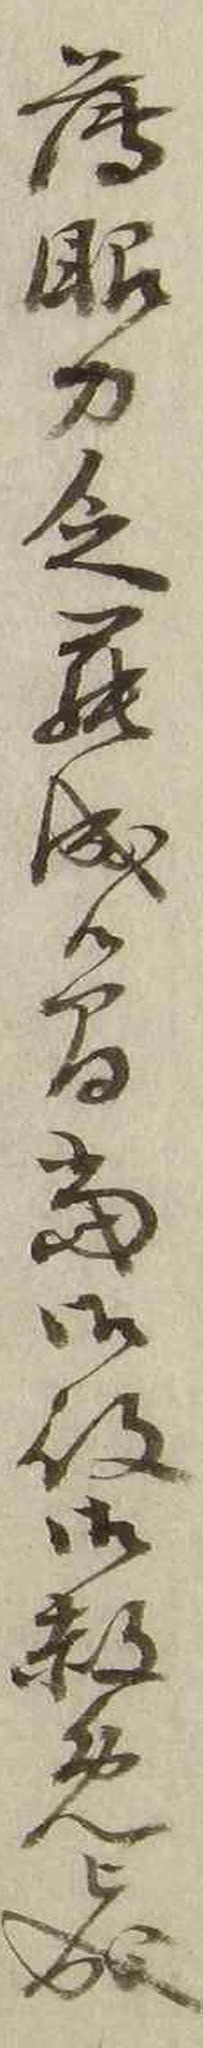薄眼力乏罷成候間当御役御赦免被成
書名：諸士系譜　巻之27　い之部27
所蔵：会津若松市立会津図書館
